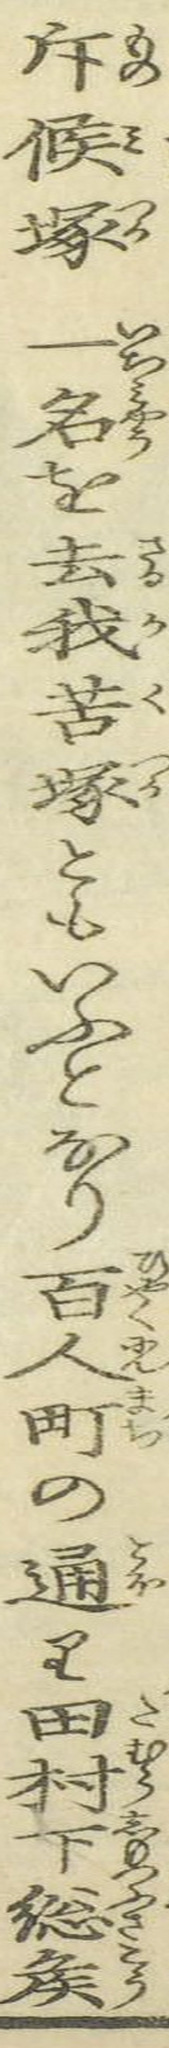斥候塚一名を去我苦塚ともいふとなり百人町の通り田村下総矦
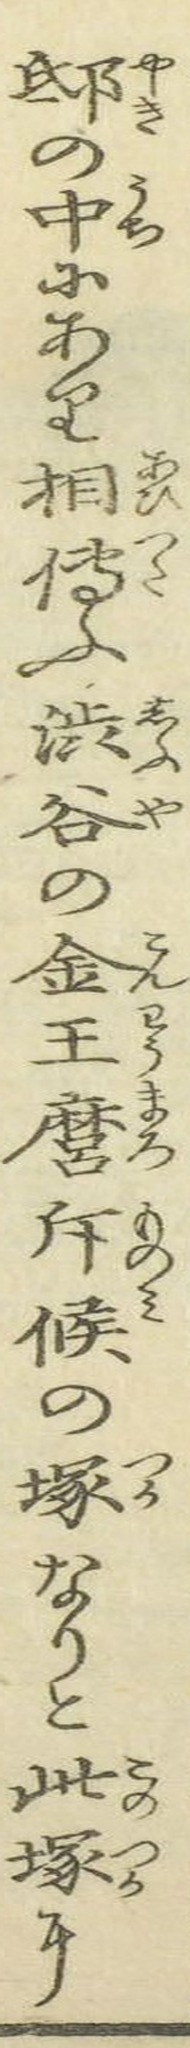邸の中にあり相傳ふ渋谷の金王麿斥候の塚なりと此塚に
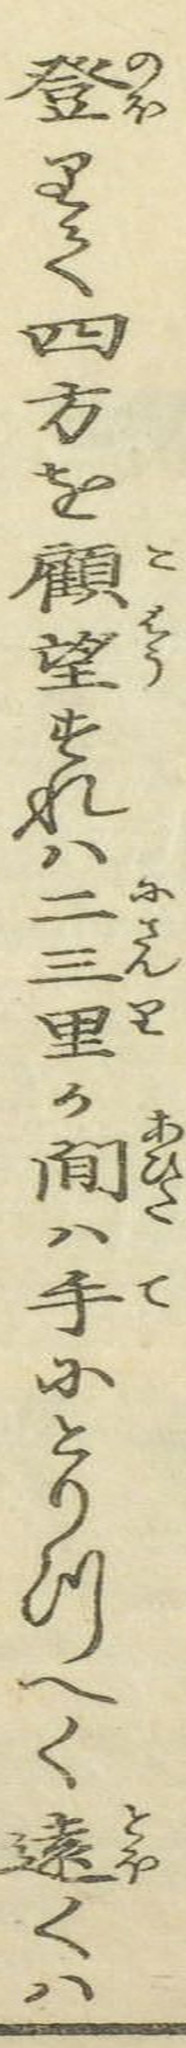登りて四方を顧望すれは二三里か間は手にとりつへく遠くは
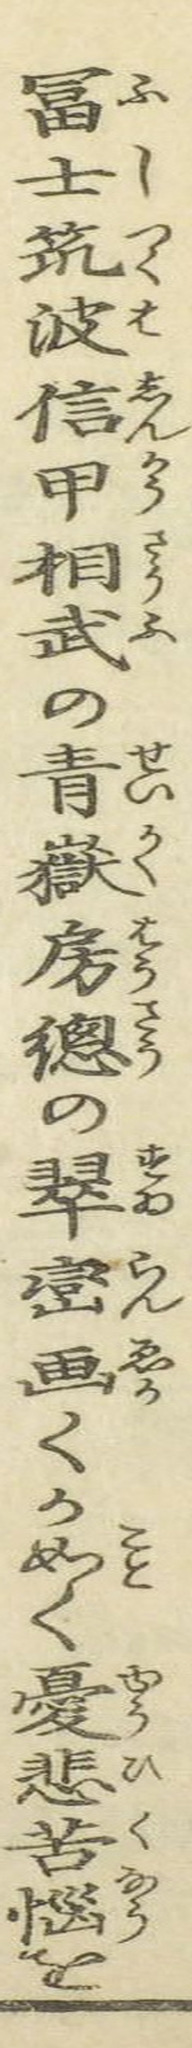冨士筑波信甲相武の青嶽房總の翠巒画くか如く憂悲苦惱を
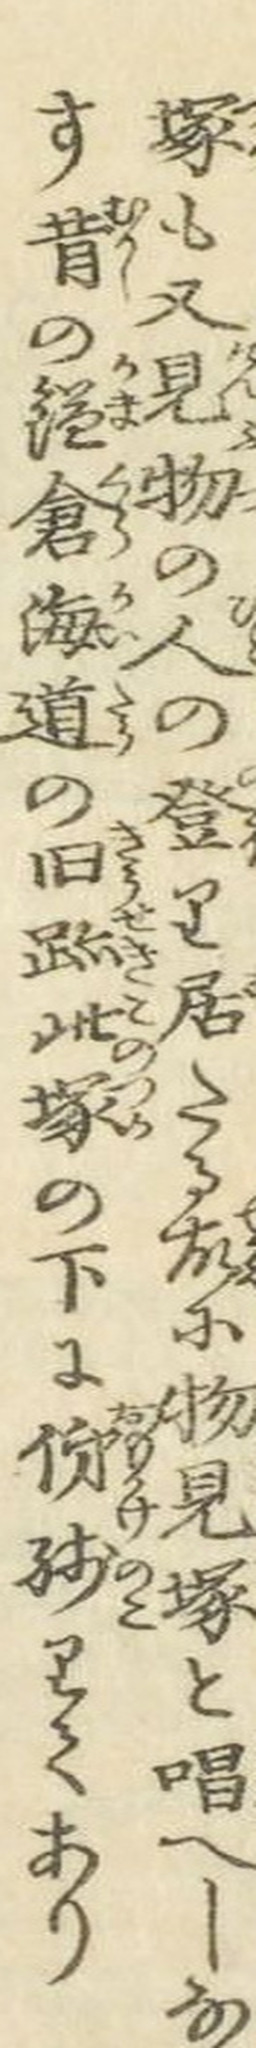す昔の鎌倉海道の旧跡此塚の下に俤残りてあり
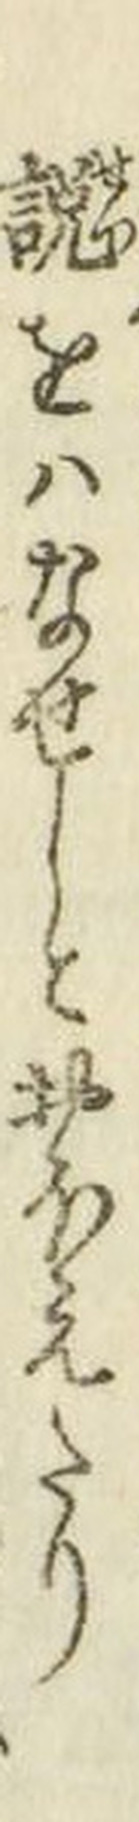説をはなせしとおほえたり
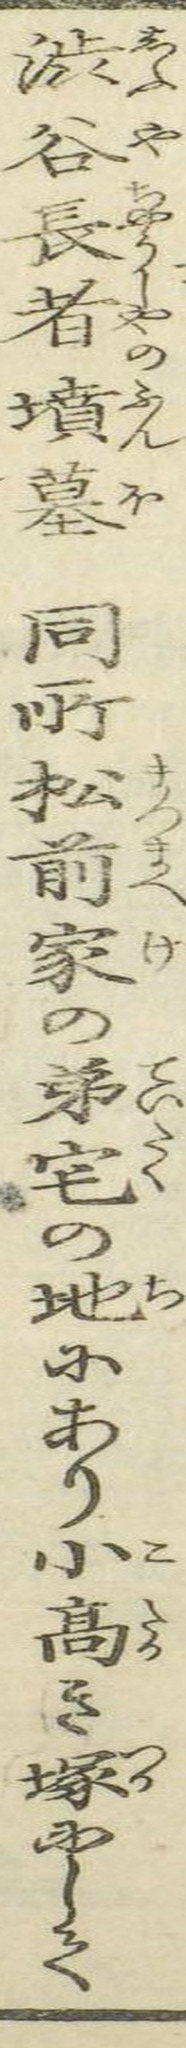渋谷長者墳墓同所松前家の弟宅の地にあり小髙き塚にして
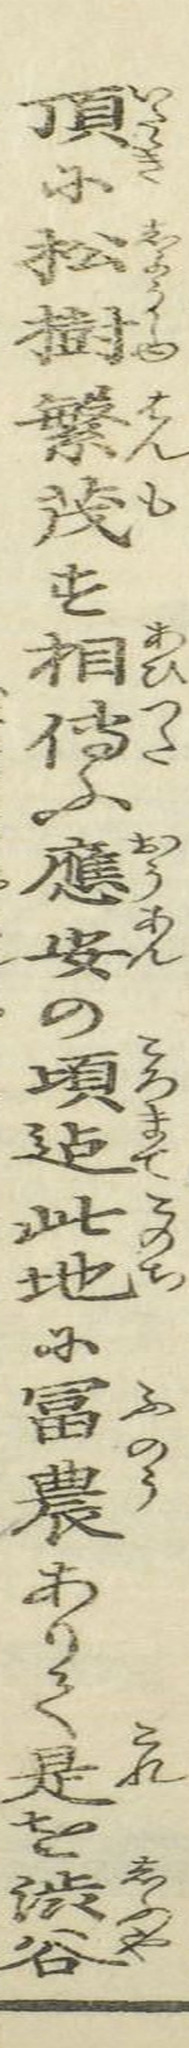頂に松樹繁茂す相傳ふ應安の頃迠此地に冨農ありて是を渋谷
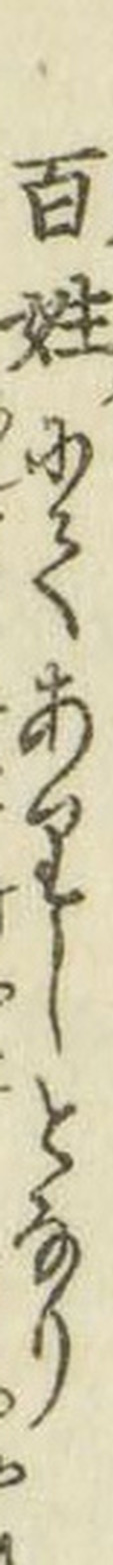百姓にてありしとなり
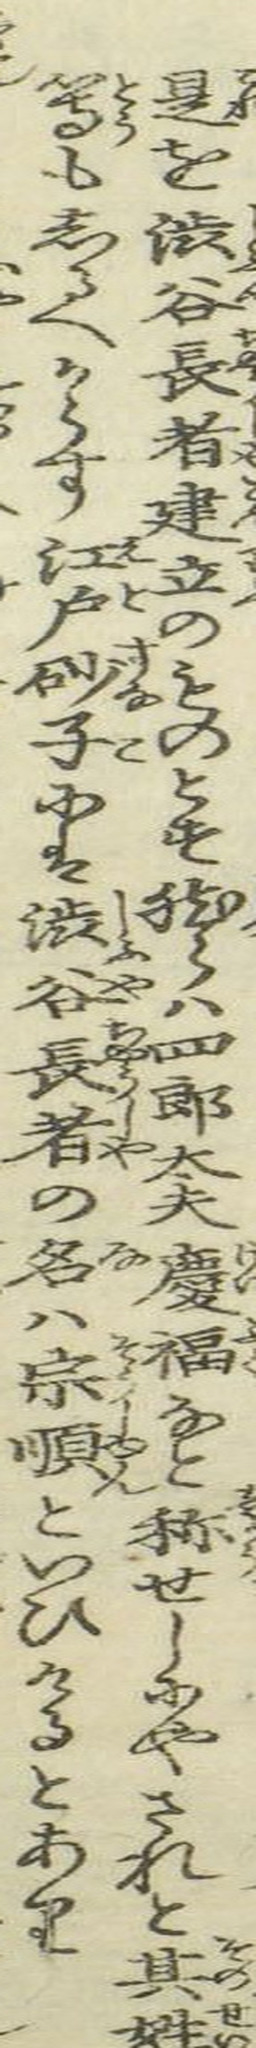等もしるへからす江戸砂子には渋谷長者の名は宗順といひけるとあり
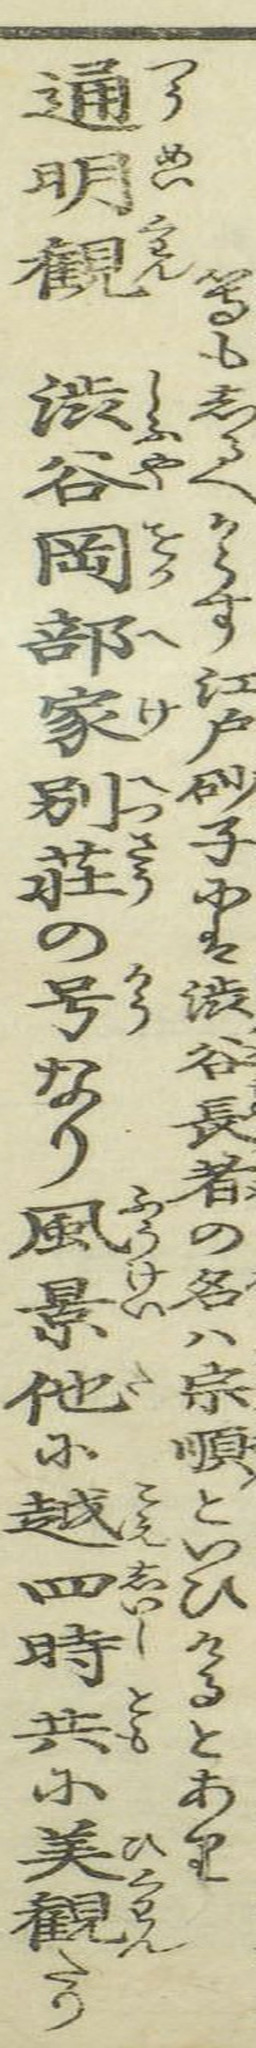通明観渋谷岡部家別荘の号なり風景他に越四時共に美観たり

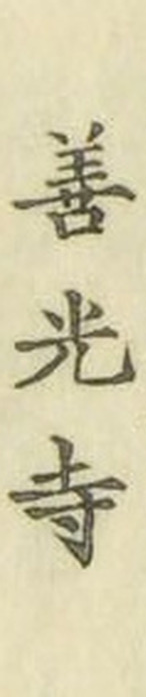善光寺

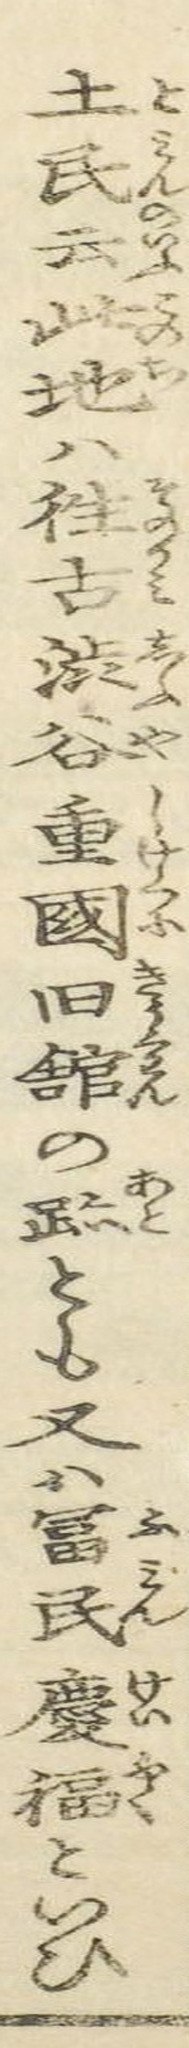土民云此地は往古渋谷重國旧舘の跡とも又は冨民慶福といひ
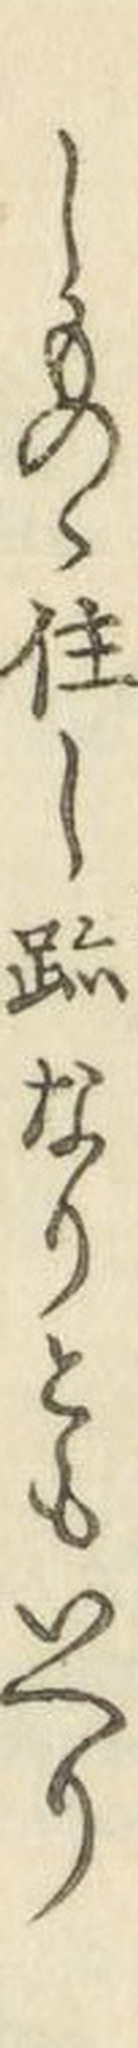しものゝ住し跡なりともいへり
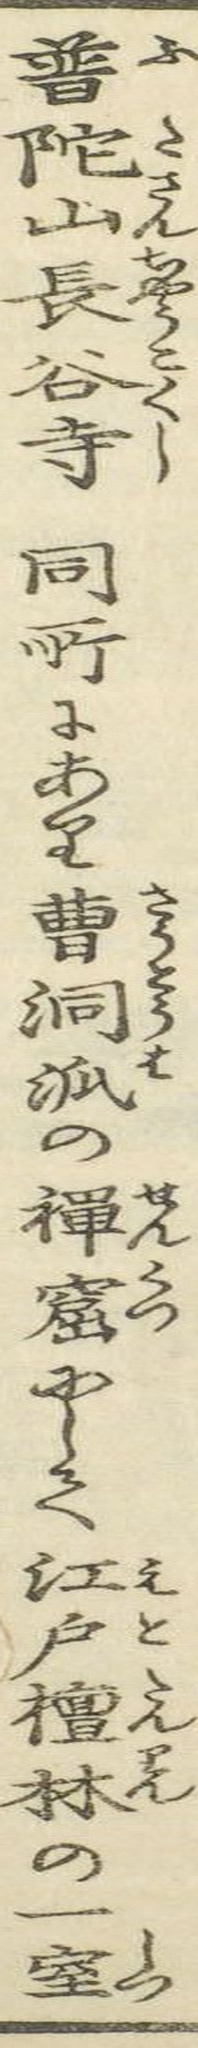普陀山長谷寺同所にあり曹洞派の禪窟にして江戸檀林の一室
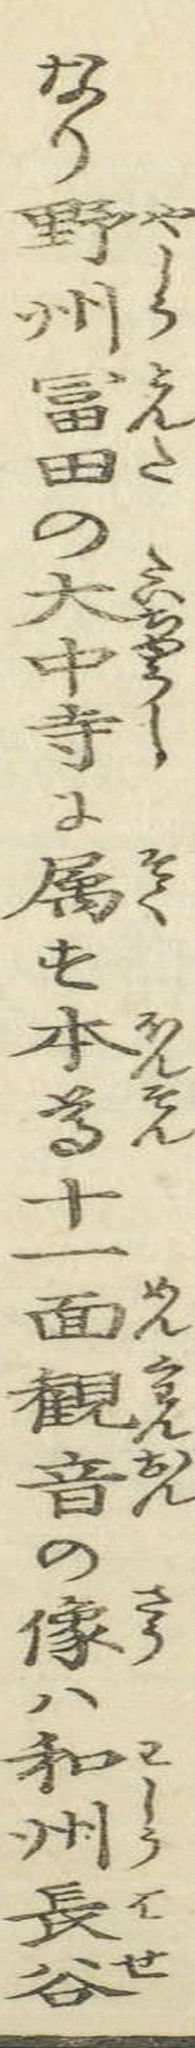なり野州冨田の大中寺に属す本尊十一面観音の像は和州長谷
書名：江戸名所図会 20巻 巻之8
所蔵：東京学芸大学教育コンテンツアーカイブ
